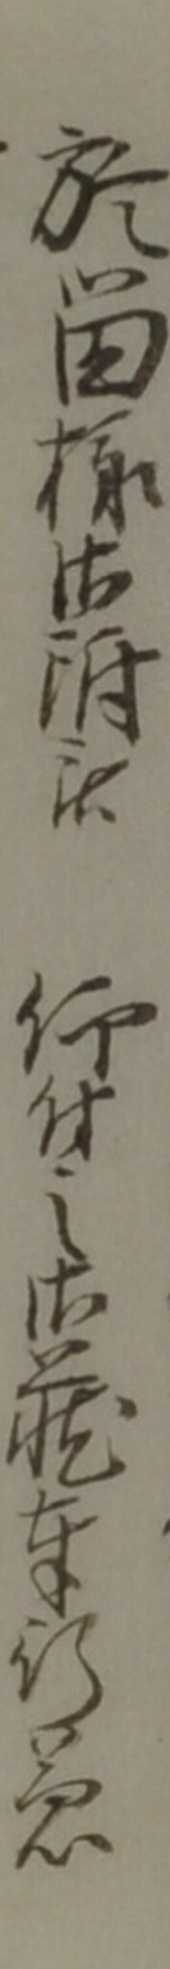於留様御附被仰付之御蔵奉行兼
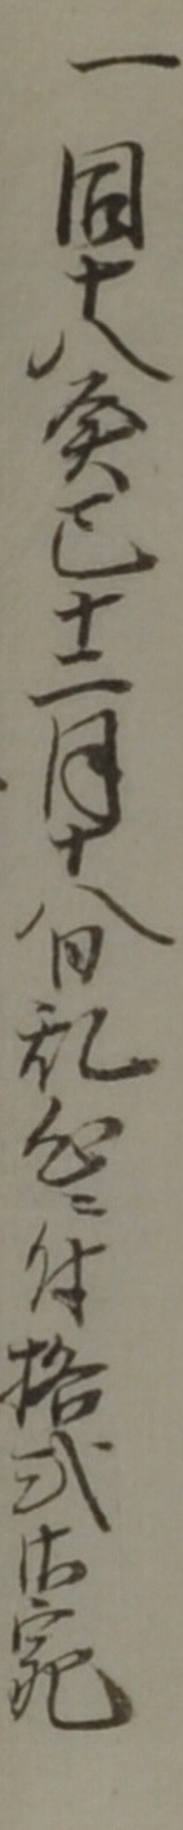一同十八癸巳十二月十八日乱心ニ付格式御宛
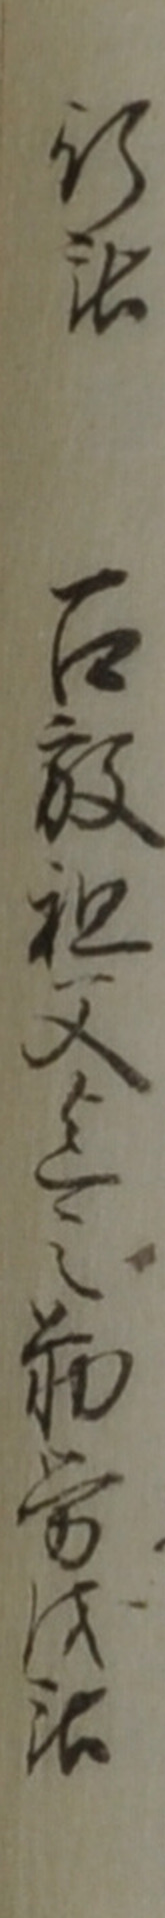行被召放祖父迄之勤労戊被
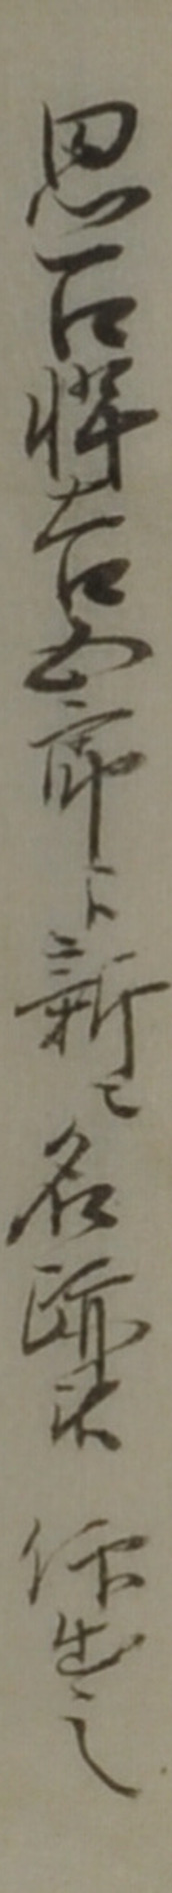思召忰吉五郎江新ニ名跡被仰出之
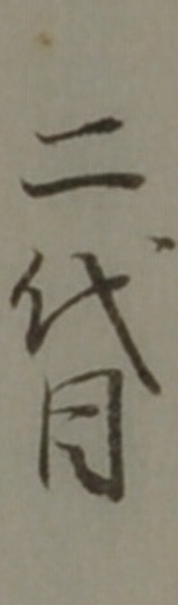二代目
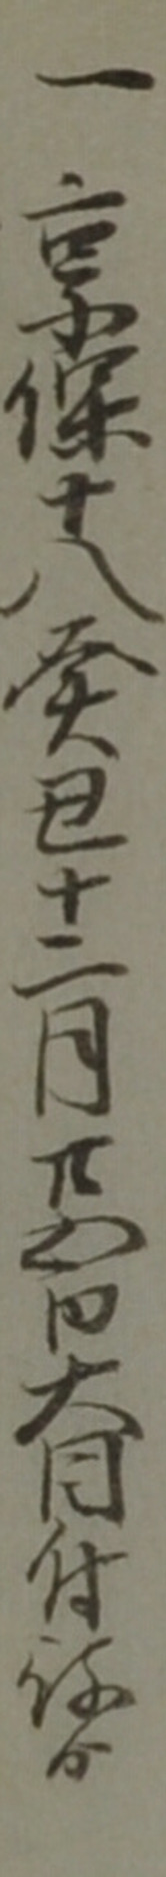一享保十八癸丑十二月廿五日大目付役ゟ
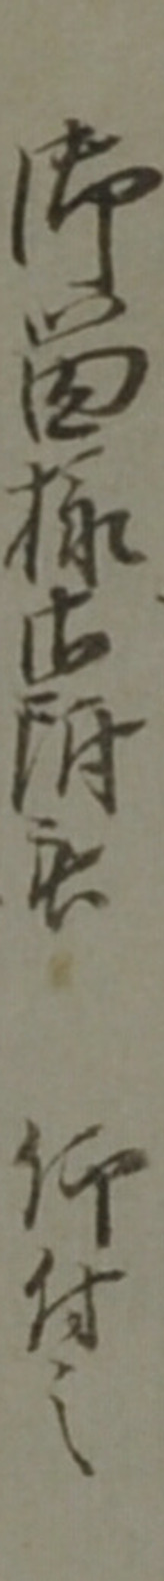御留様御附被仰付之
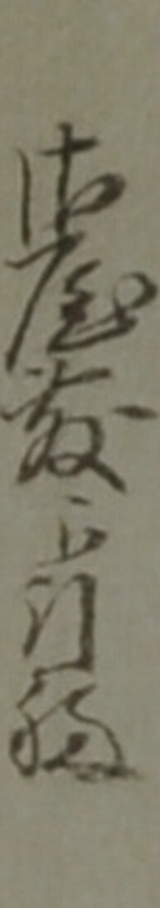御屋敷江引移
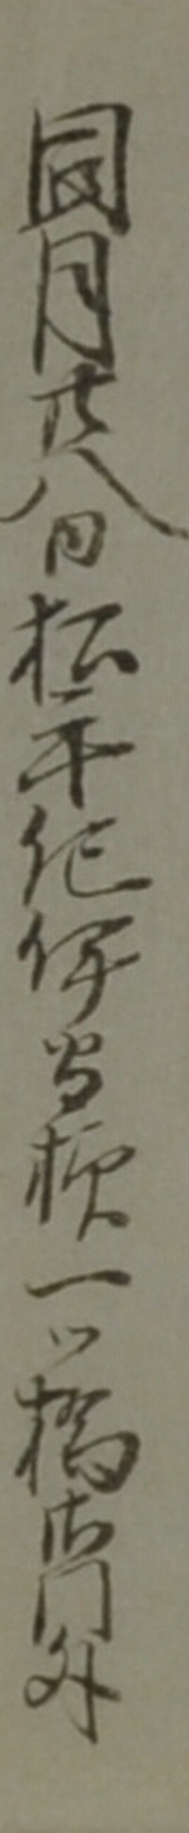同月廿八日松平紀伊守様一ツ橋御門外
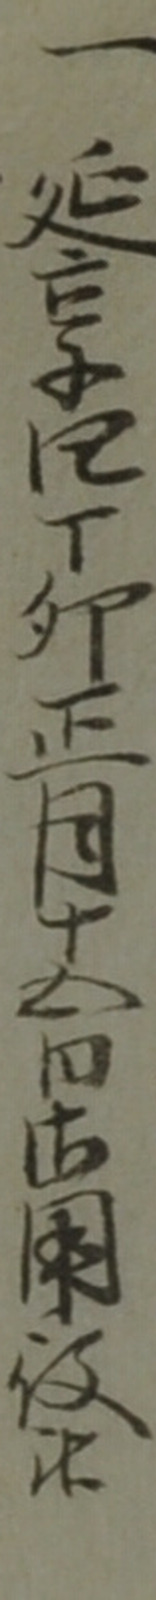一延享四丁卯正月十五日御用役被
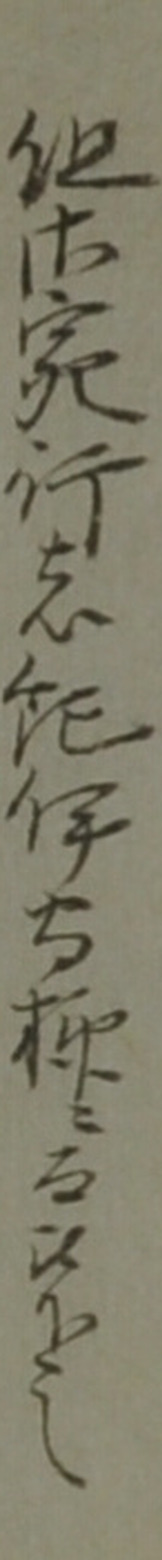但御宛行者紀伊守様ニ而被下之
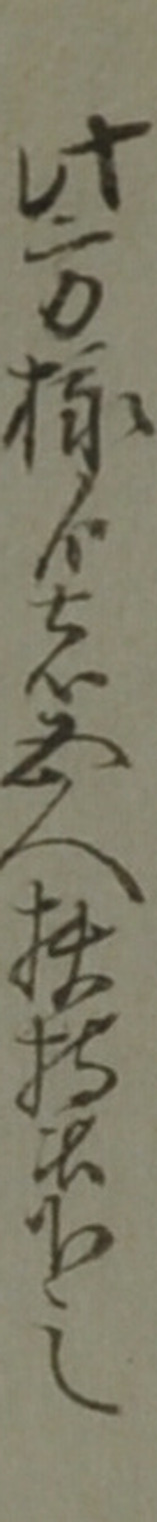此方様ゟ者五人扶持被下之
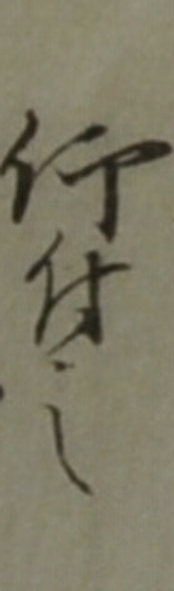仰付之
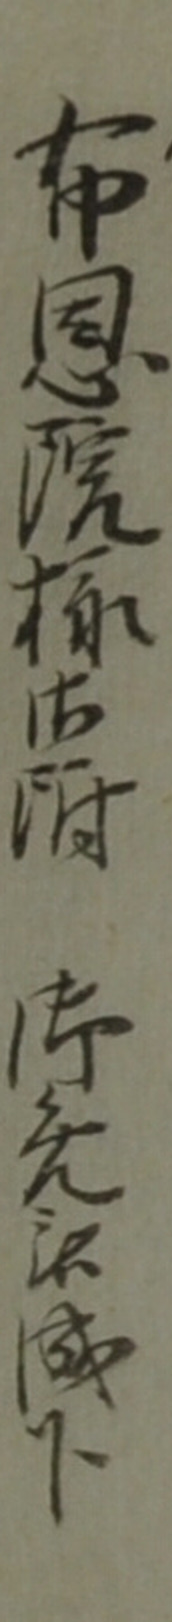布恩院様御附御免被成下
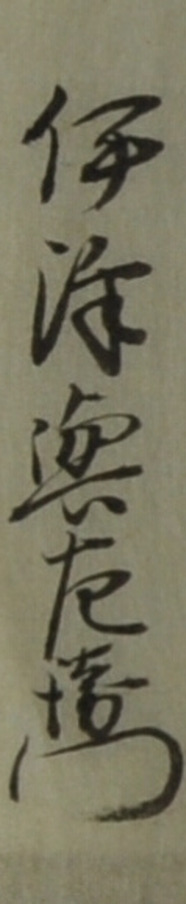伊津與左衛門

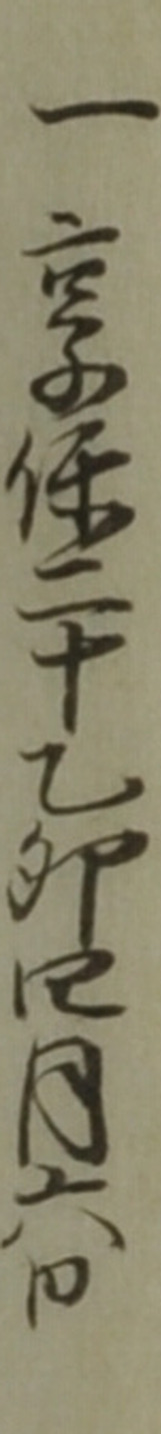一享保二十乙卯四月六日
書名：諸御役代々録（六）
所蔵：伊那市立高遠町図書館・合同会社AMANE
